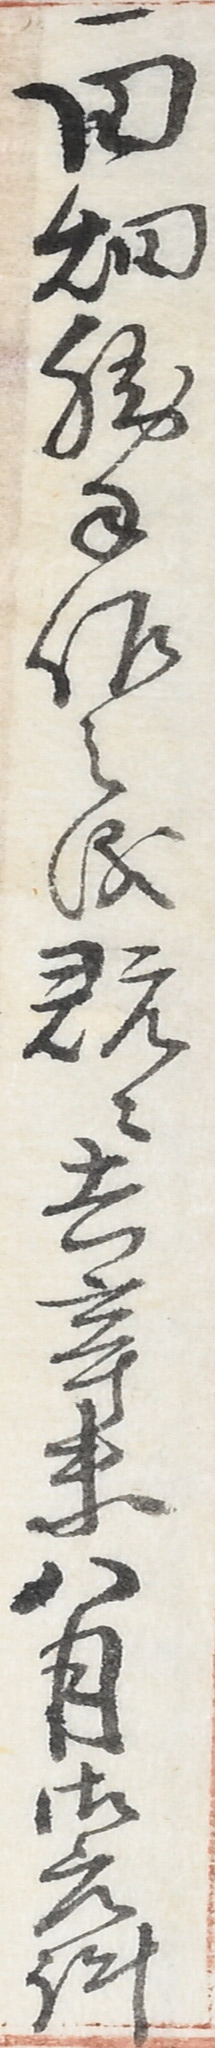一田畑勝手作之儀既に去辛未八月御差許

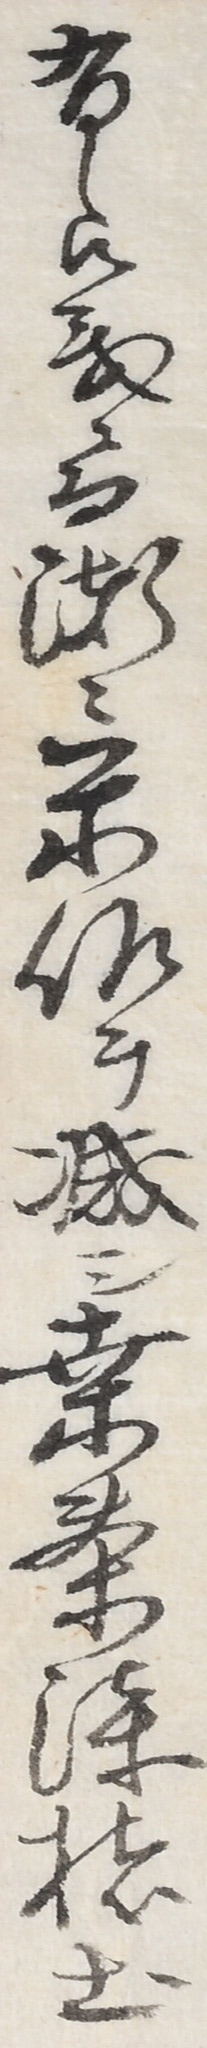有之候義にて漸々米作を減し桑茶漆楮土
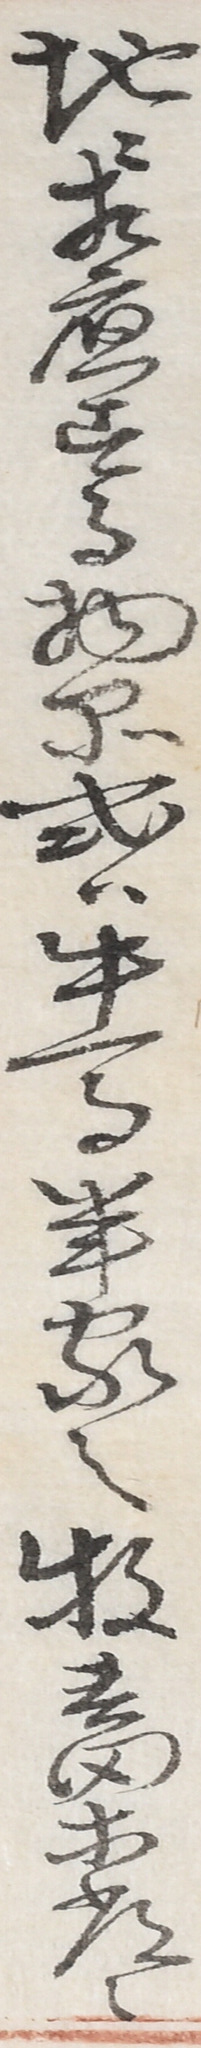地ニ相応する物品或は牛馬羊豕之牧畜等常之
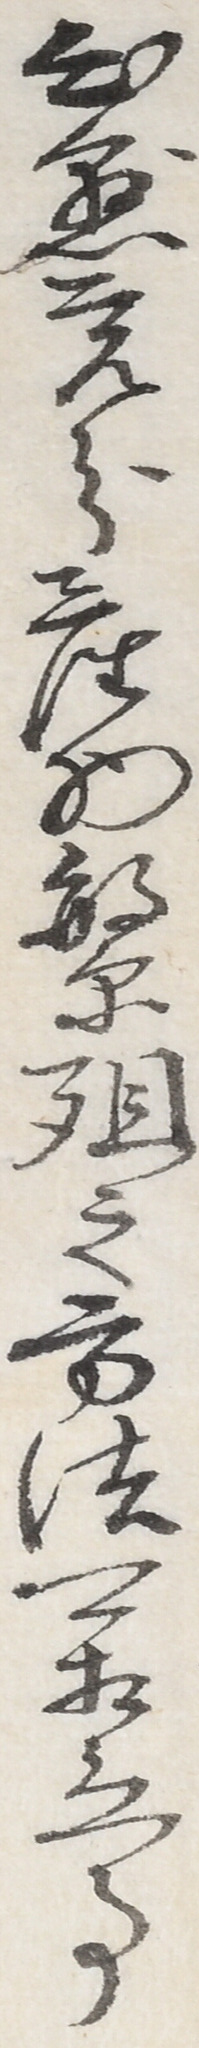心懸充分産物繁殂之方法可相立事
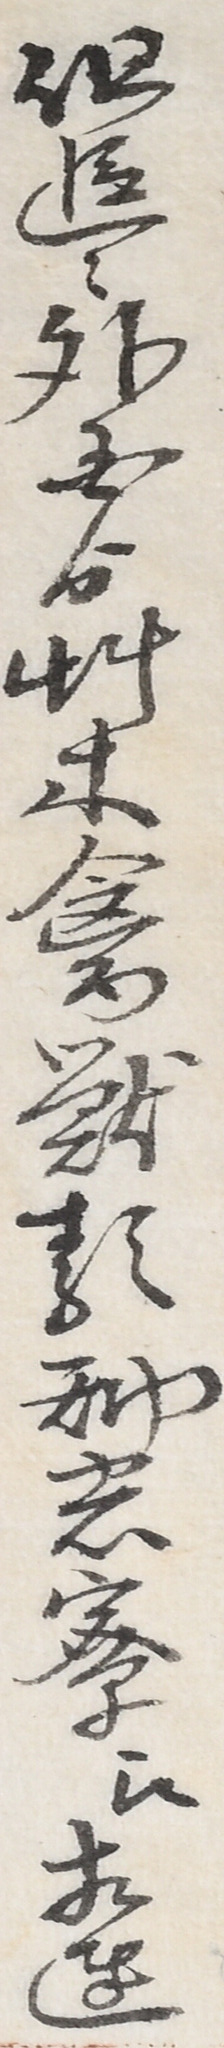但追々外国より草木禽獣類蚕寮え相達
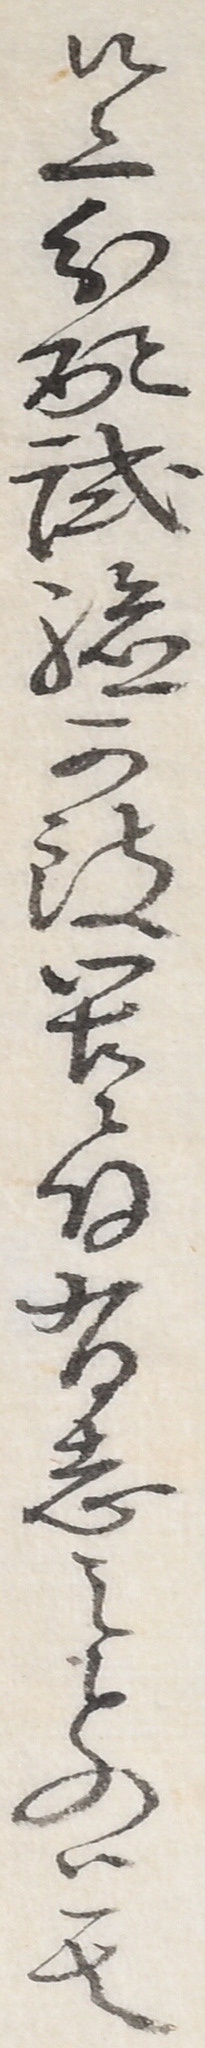候上分配試験可致筈に付有志之ものは其
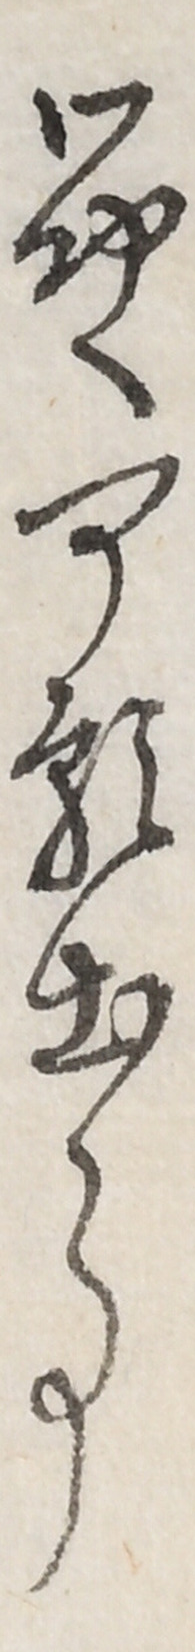筋へ可願出事
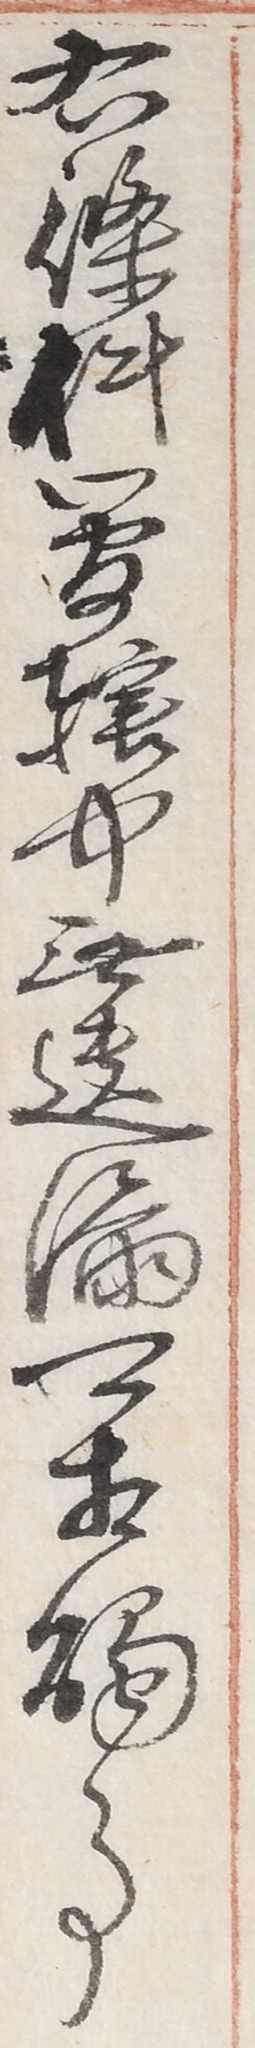右條件管轄中無遺漏可相触事
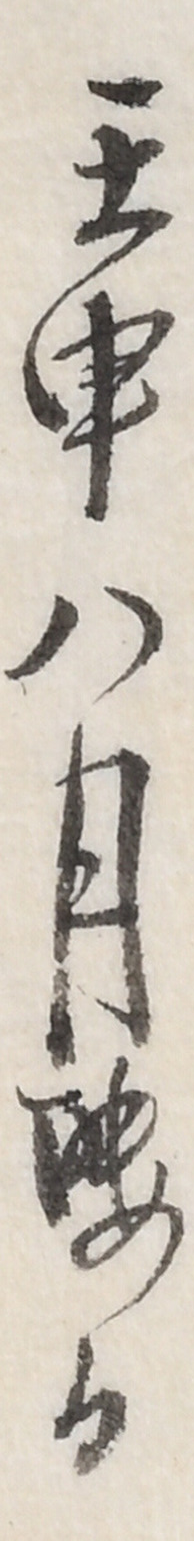壬申八月晦日
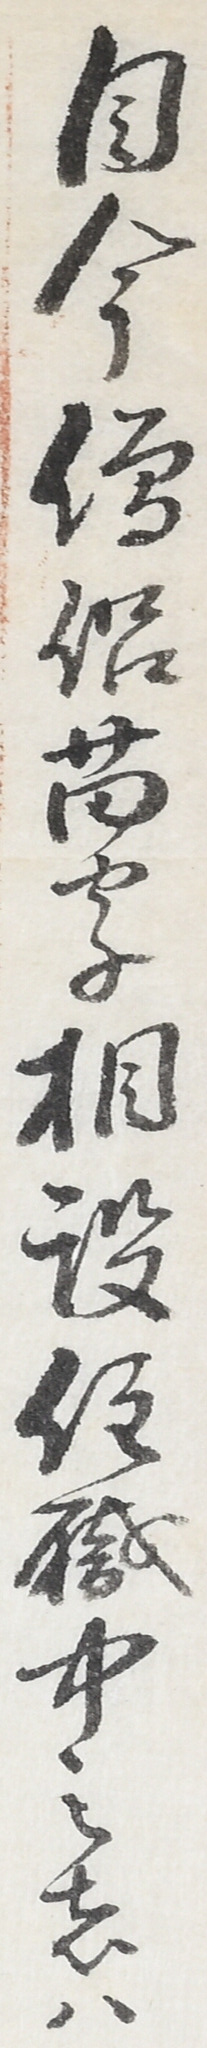自今僧侶苗字相設住職中之者は
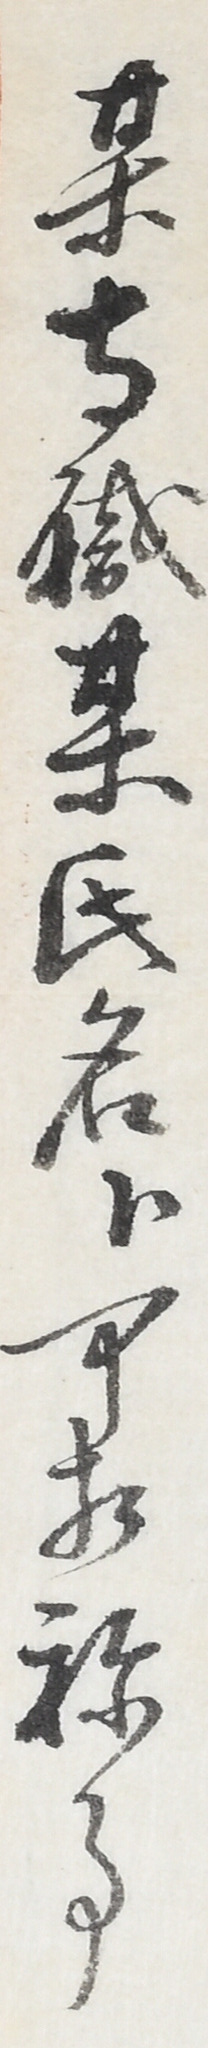某寺職某氏名ト可相称事
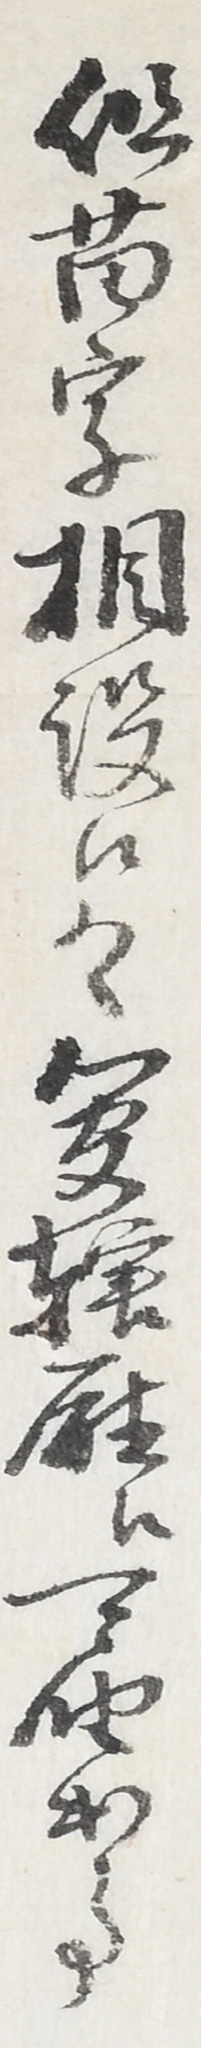但苗字相設候はゝ管轄庁え可届出事
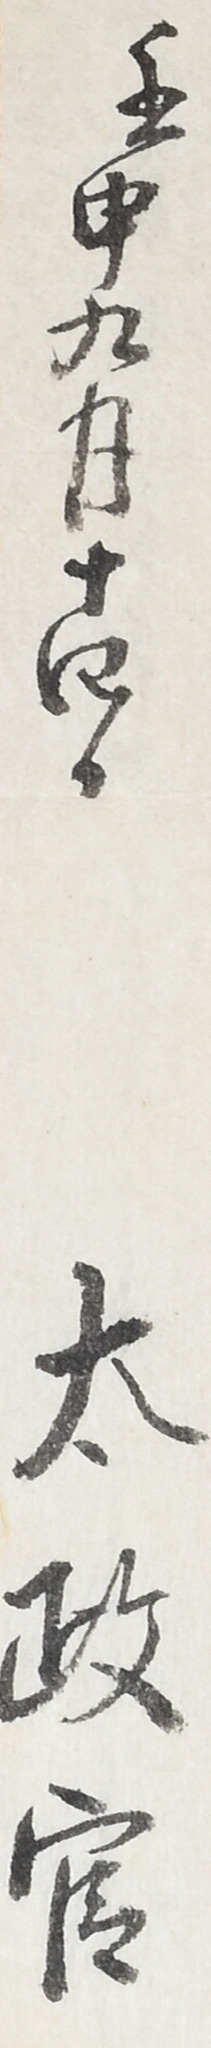壬申九月十四日太政官
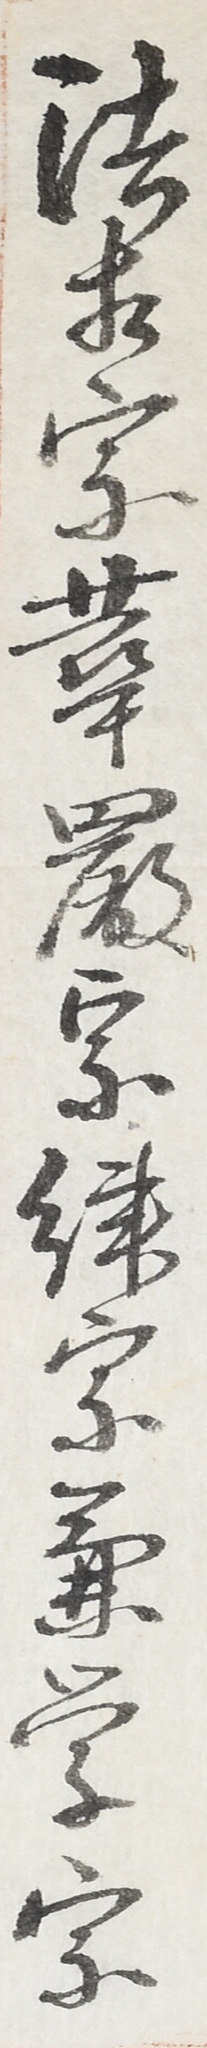法相宗華厳宗律宗兼学宗
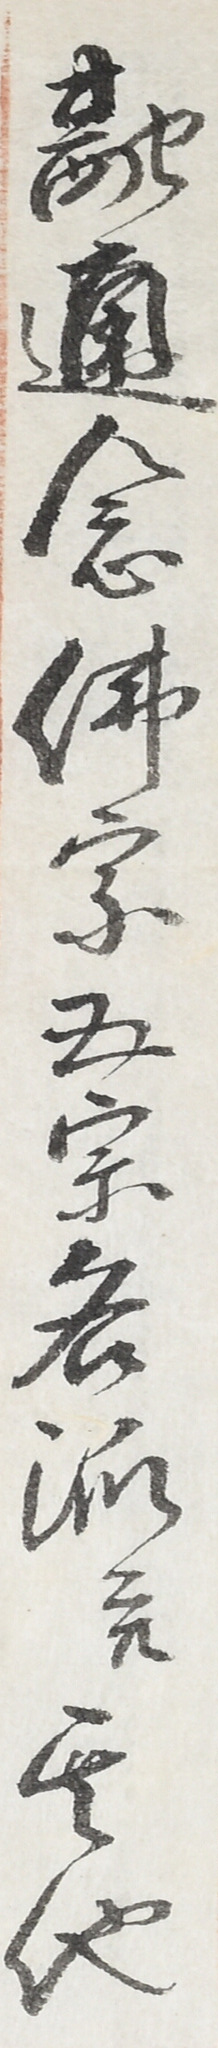融通念仏宗五宗各派幷其他
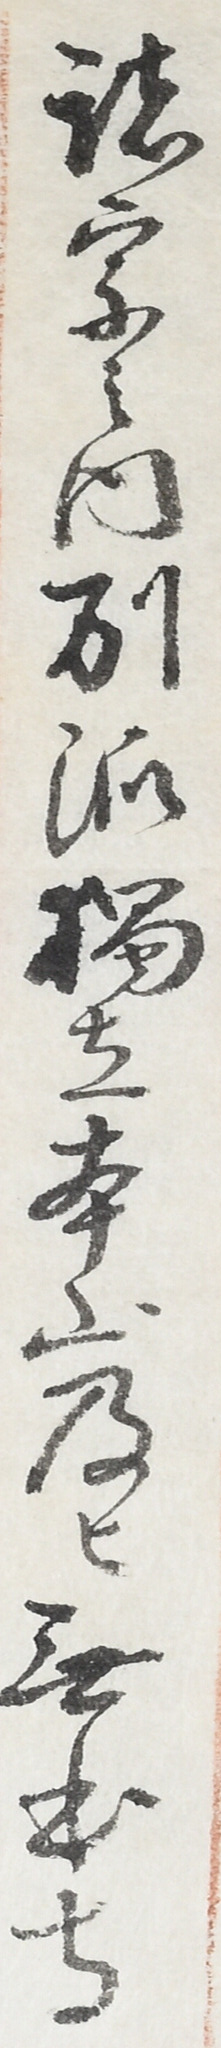諸宗之内別派独立本山及ひ無本寺
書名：壹番・御布告一式
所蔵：伊那市立高遠町図書館・合同会社AMANE
